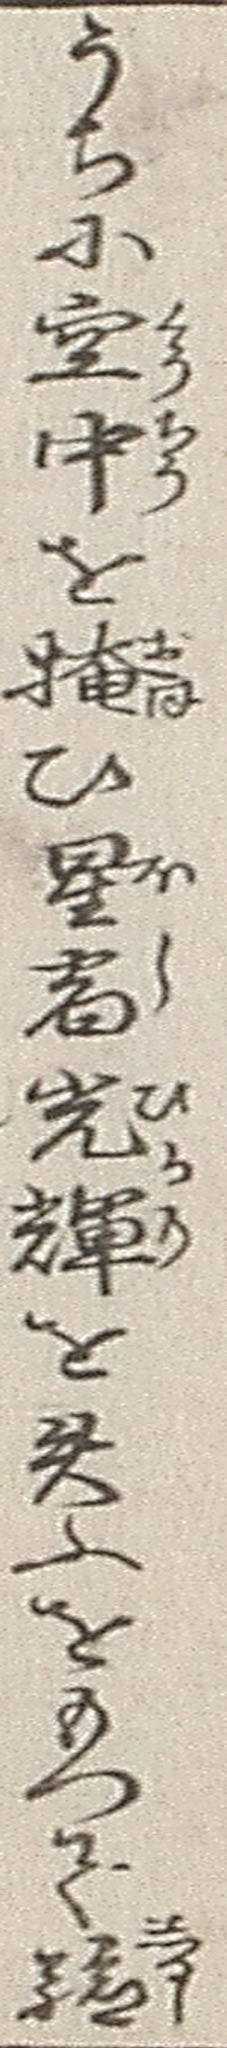うちに空中を掩ひ星宿光輝を失ふをもつて験
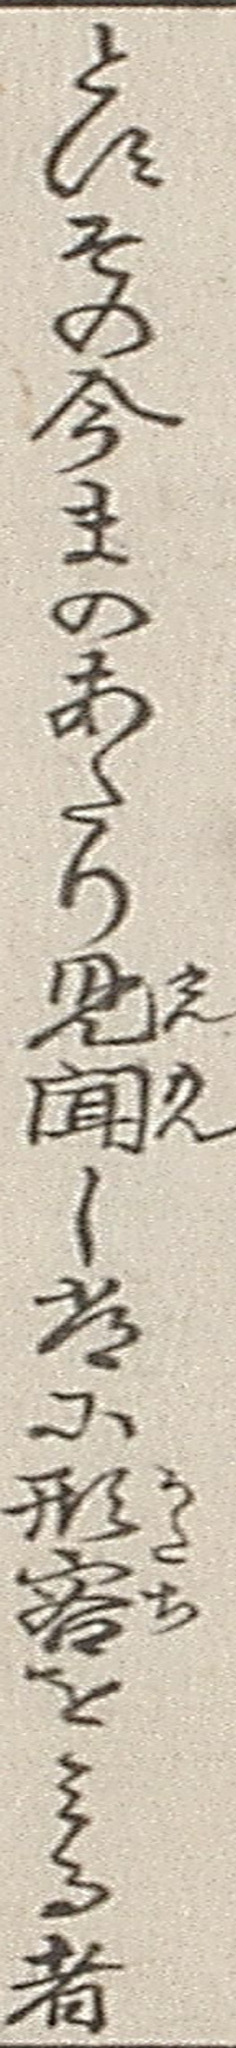とすその今まのあたり見聞し常に形容をみる者
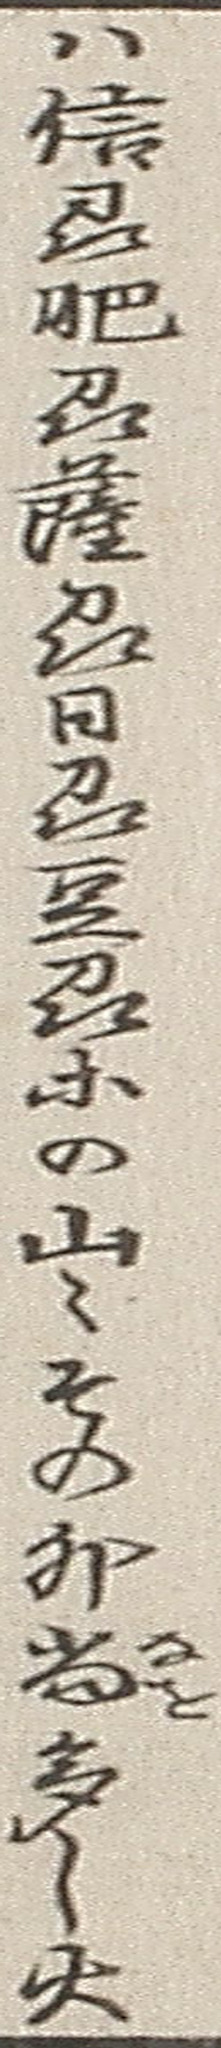は信州肥州薩州日州豆州等の山〻その外尚多し火
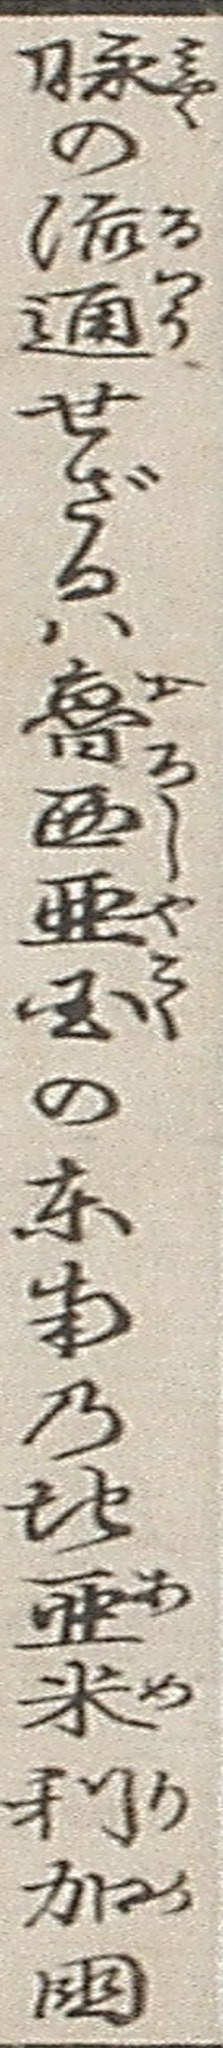脈の流通せざるは魯西亜国の東南の地亜米利加国
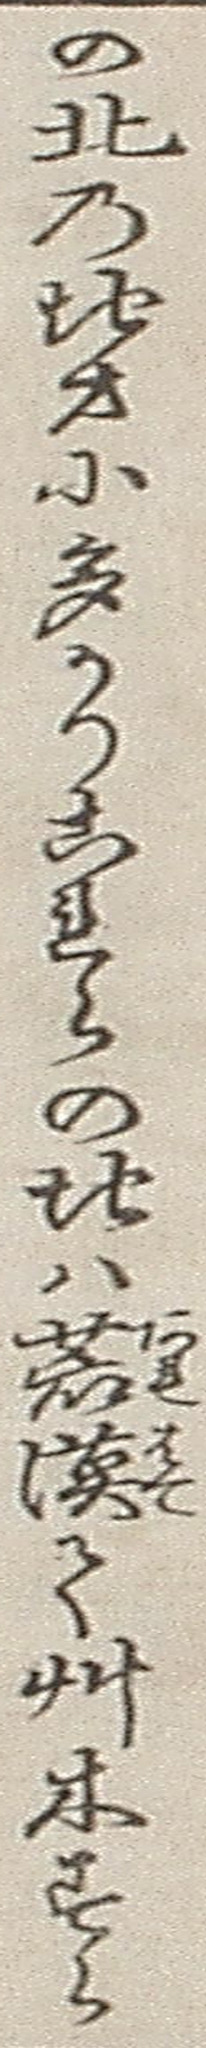の北の地方に多かりこれらの地は荒漠て艸木すら
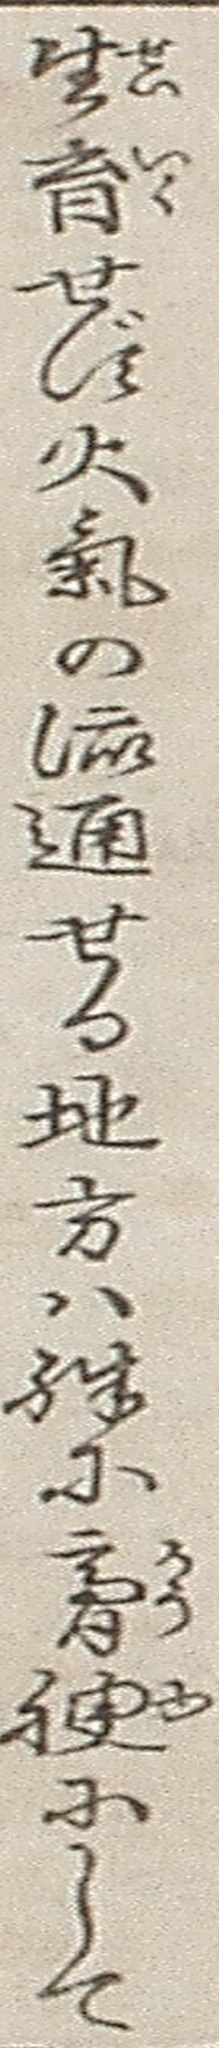生育せず火気の流通せる地方は殊に膏腴にして
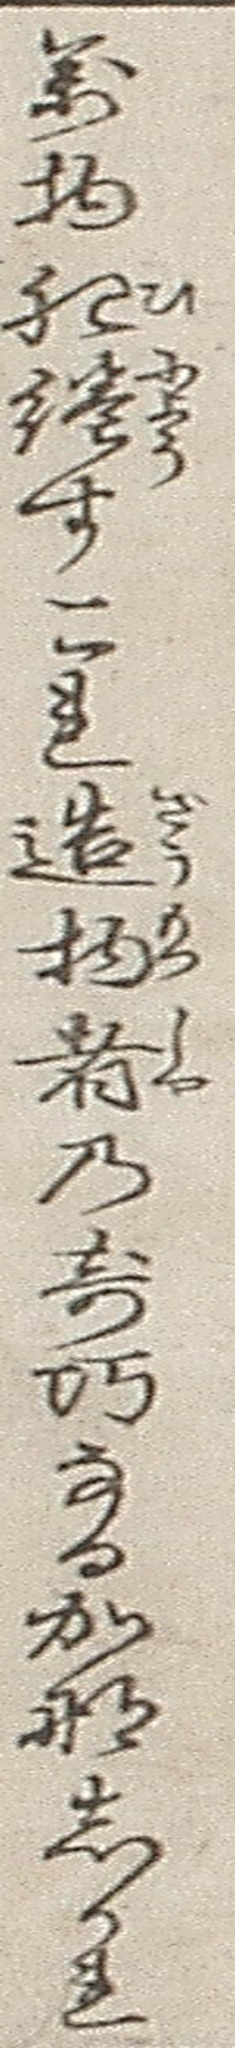萬物肥饒すこれ造物者の奇巧なるかなしかれ
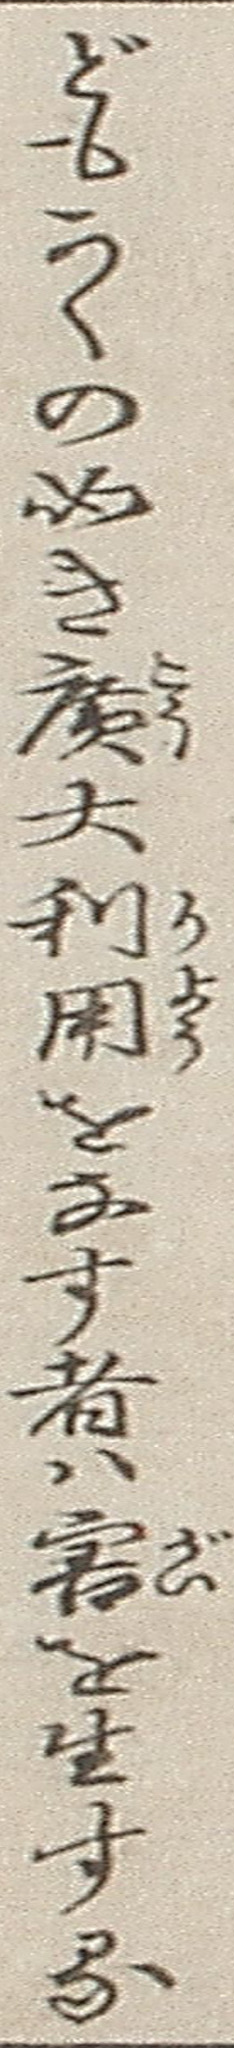どもかくの如き広大利用をなす者は害を生する
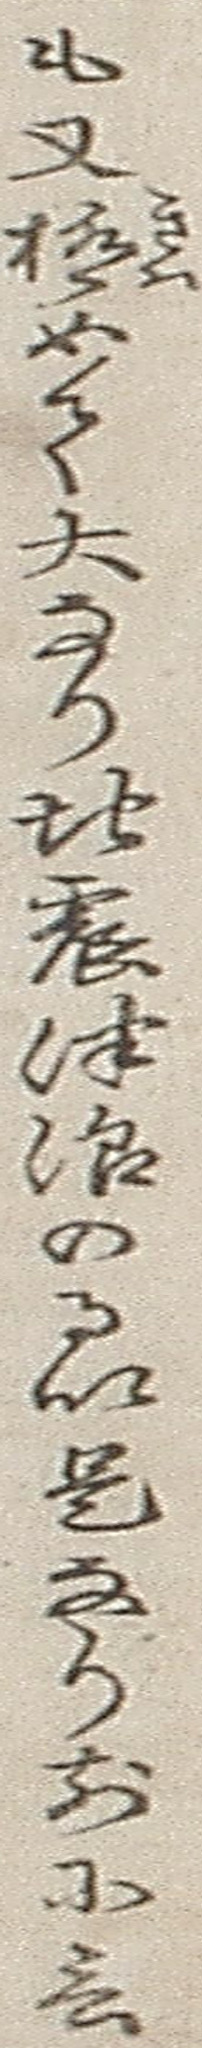も又極めて大なり地震津浪のるい是なり前に云

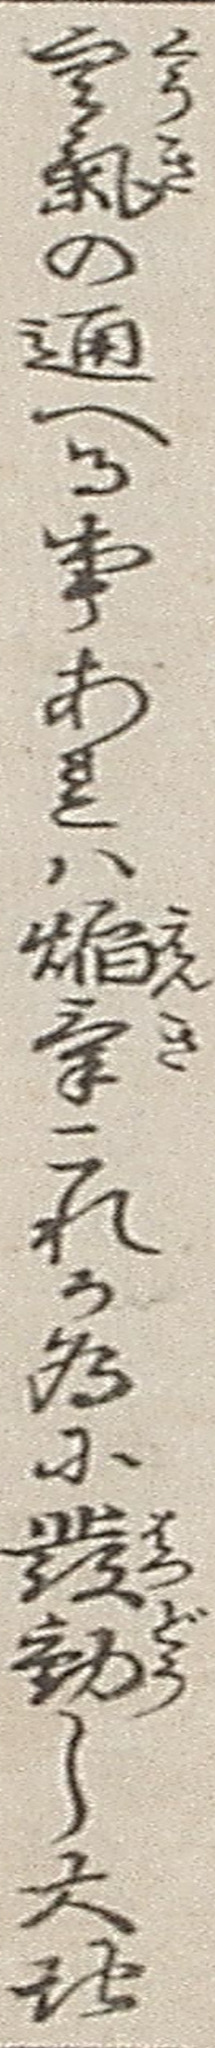空気の通へる事あれハ焔気これか為に発動し大地
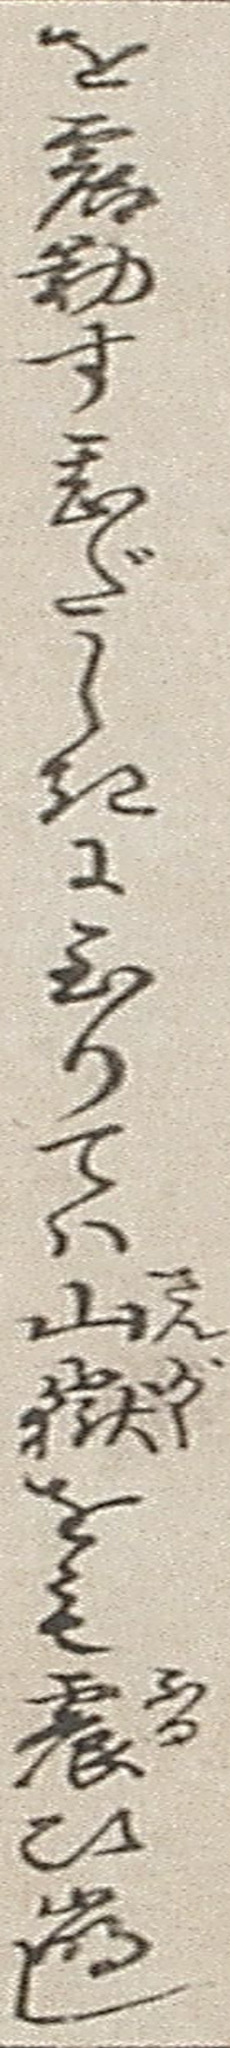を震動す甚しきに至りてハ山嶽をも震ひ崩し
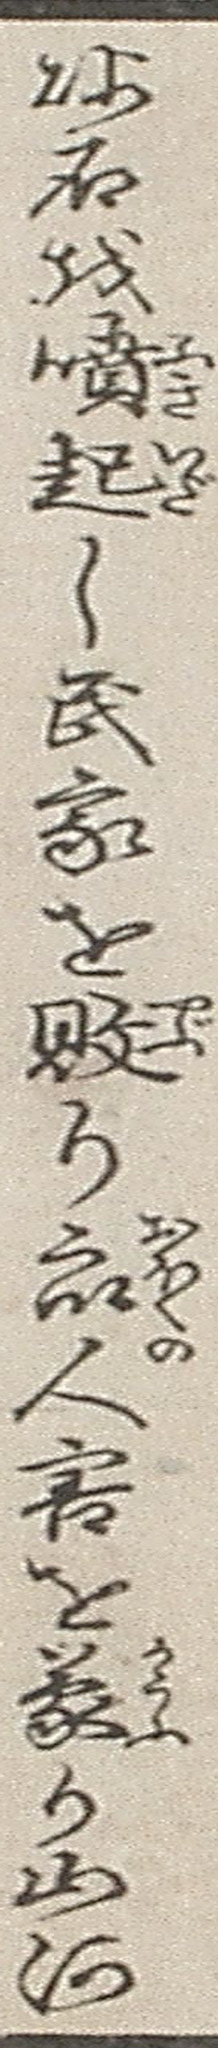砂石を噴起し民家を敗り衆人害を蒙り山河
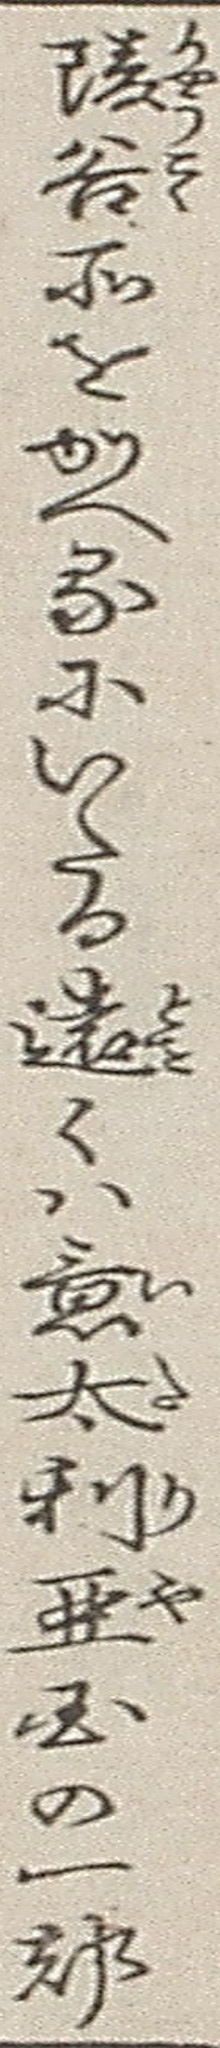陵谷をかへるにいたる遠くハ意太利亜国の一都
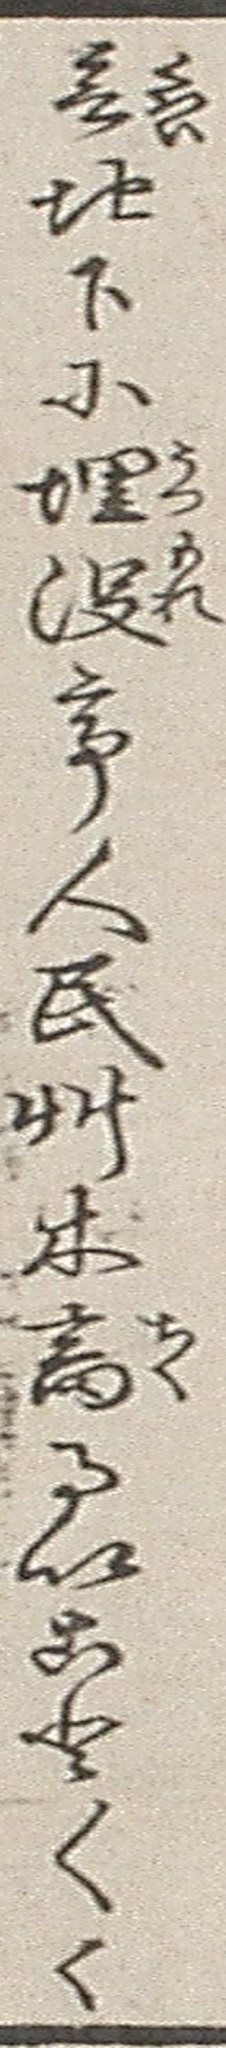会地下に埋没て人民草木畜るいこと〳〵く
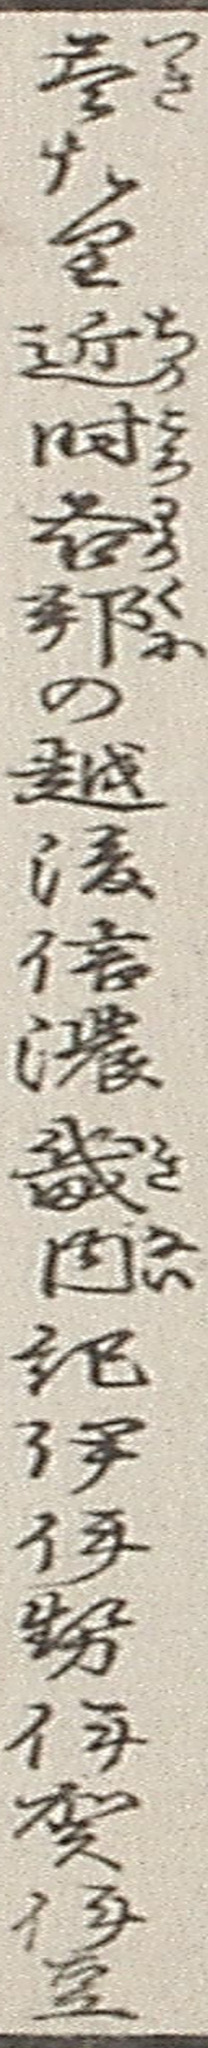尽たり近時吾邦の越後信濃畿内紀伊伊勢伊賀伊豆
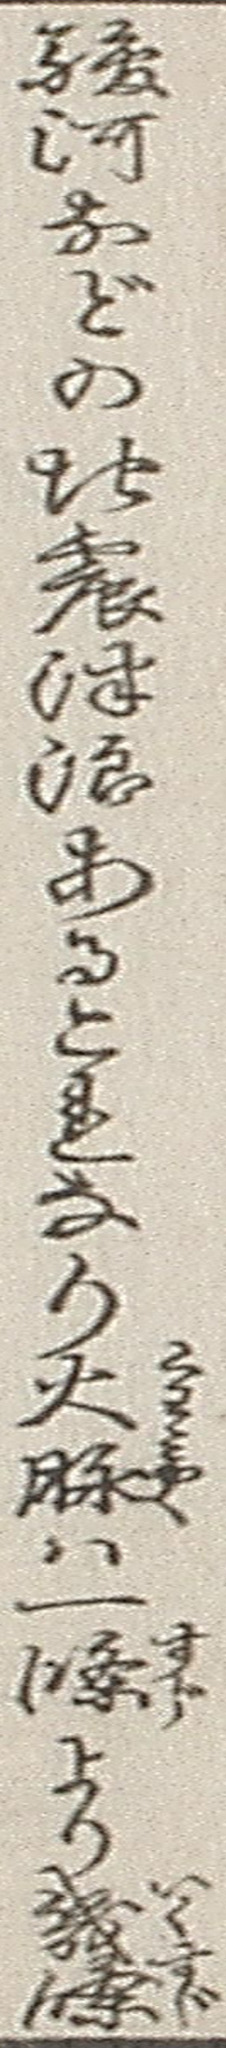駿河などの地震津浪あるこれなり火脈ハ一條より幾條
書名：大地震暦年考　全
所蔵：東京大学地震研究所図書室 Earthquake Research Institute Library, The University of Tokyo, JAPAN
